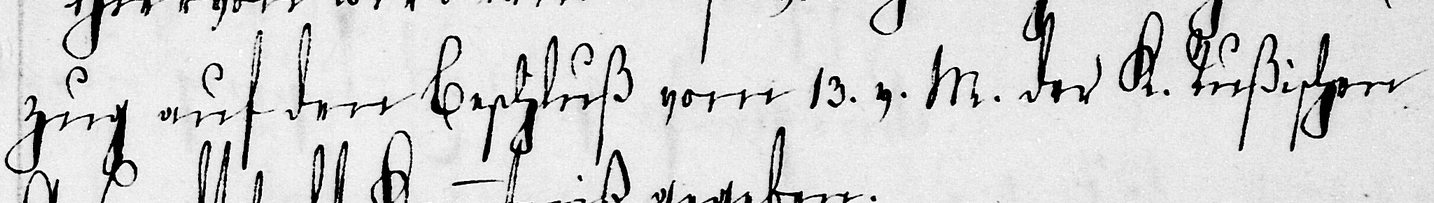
zug auf den Beschluß vom 13. v. M. der K. Rußischen
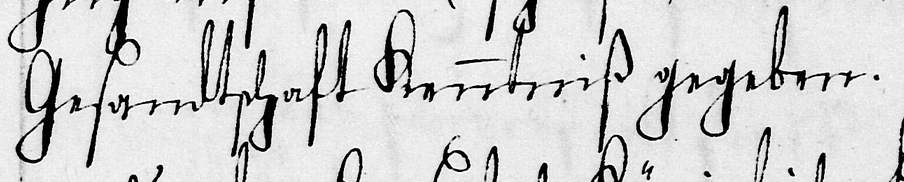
Gesandtschaft Kenntniß gegeben.
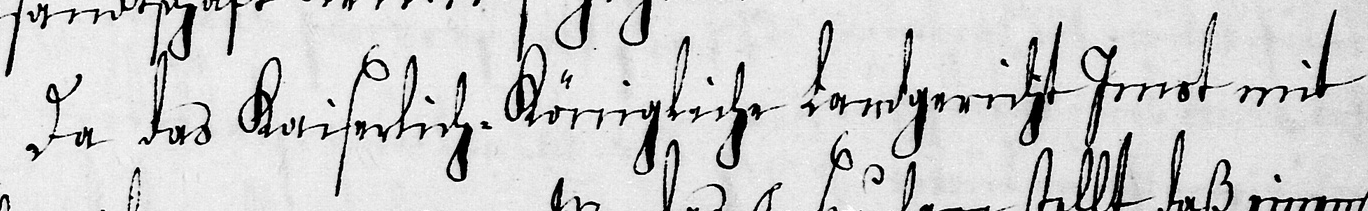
Da das Kaiserlich-Königliche Landgericht Imst mit
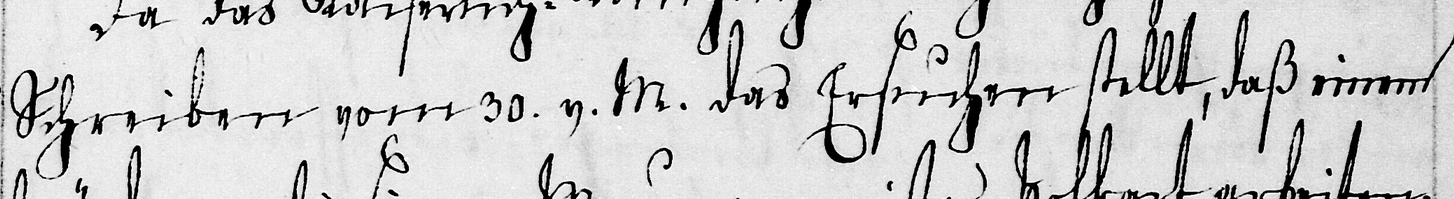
Schreiben vom 30. v. M. das Ersuchen stellt, daß einem
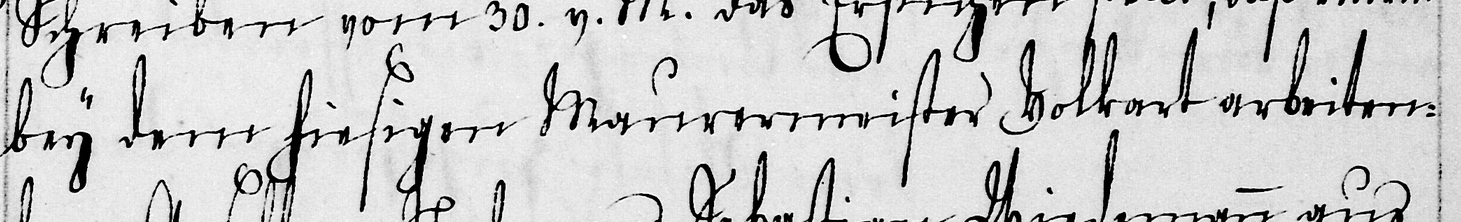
bey dem hiesigen Maurermeister Volkart arbeiten¬
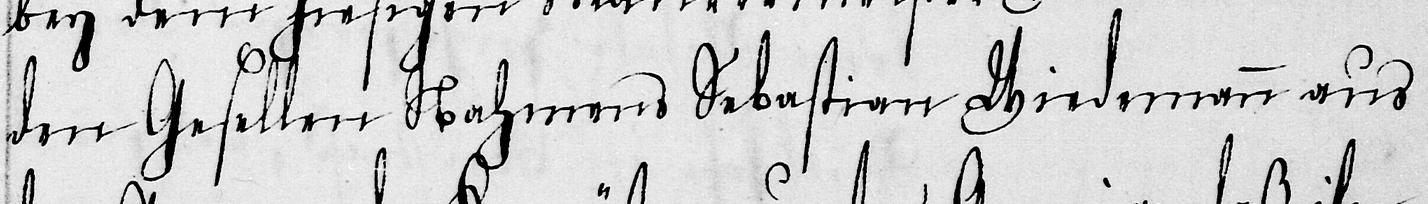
den Gesellen Nahmens Sebastian Wiedemann aus
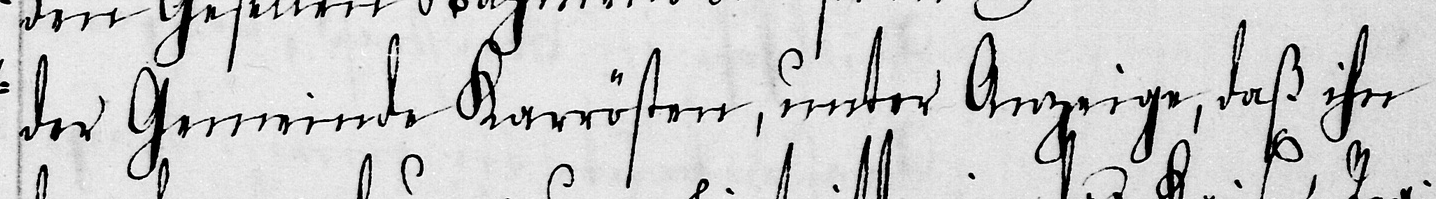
der Gemeinde Karrösten, unter Anzeige, daß ihn
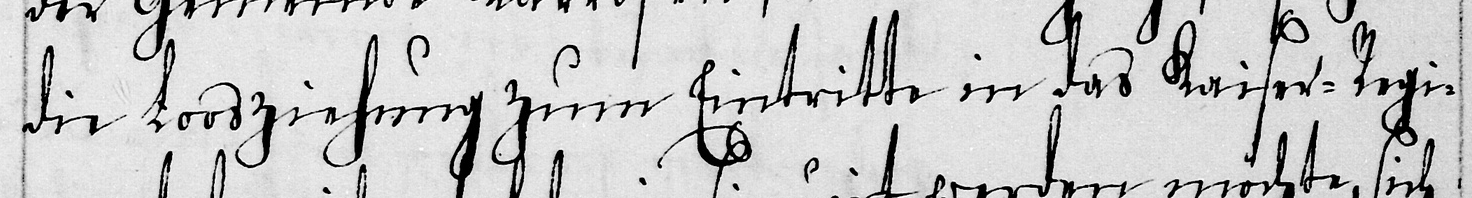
die Loosziehung zum Eintritte in das Kaiser-Regi¬
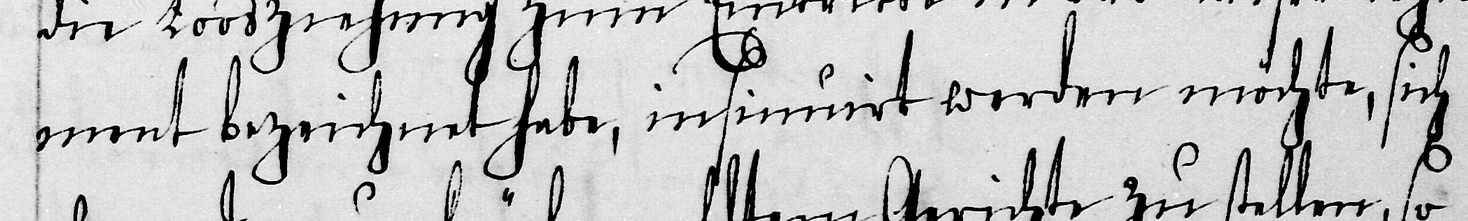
ment bezeichnet habe, insinuirt werden möchte, sich
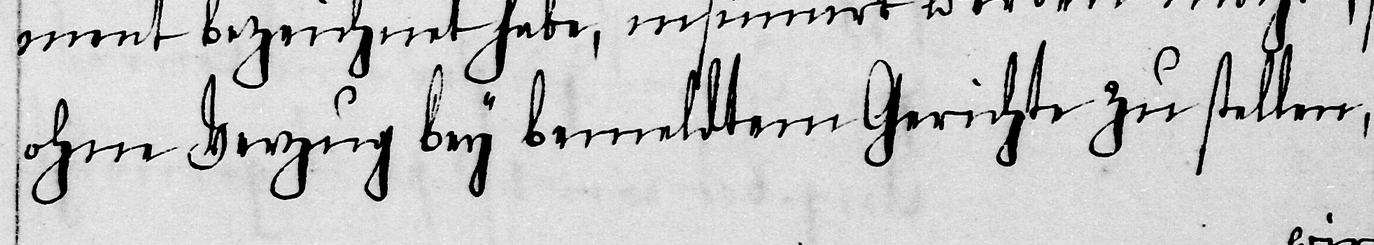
ohne Verzug bey bemeldtem Gerichte zu stellen,
